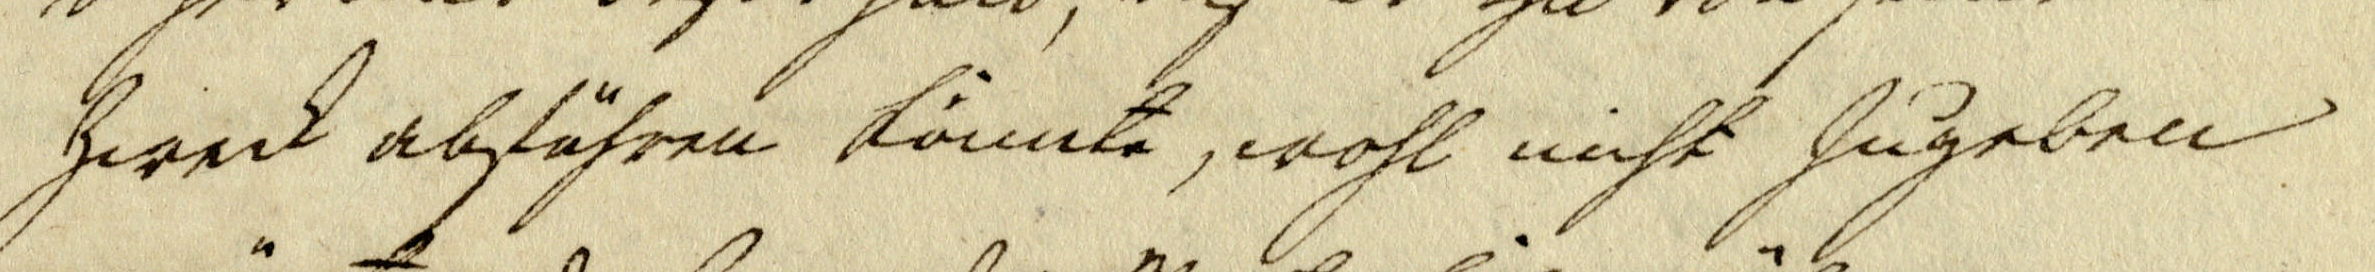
Zweck abführen könnte, wohl nicht zugeben
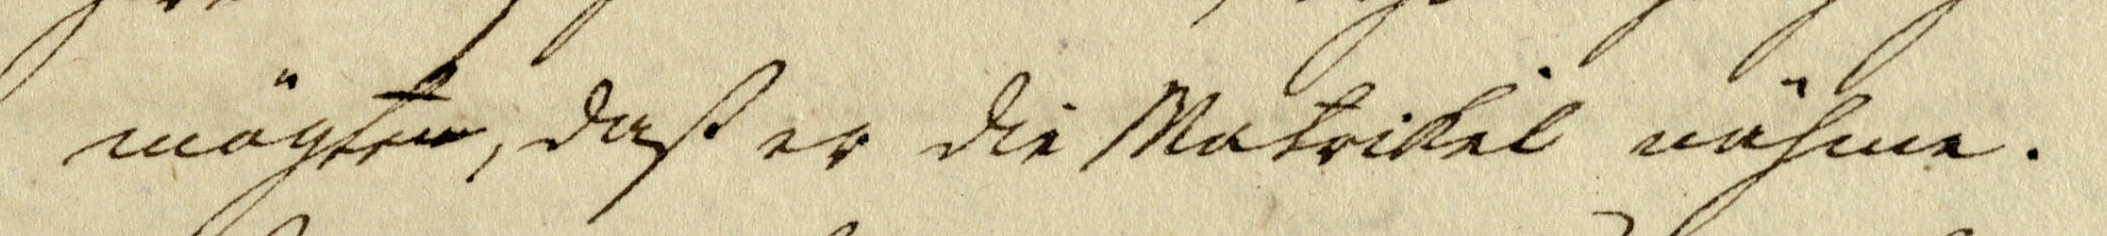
mögten, daß er die Matrikel nähme.
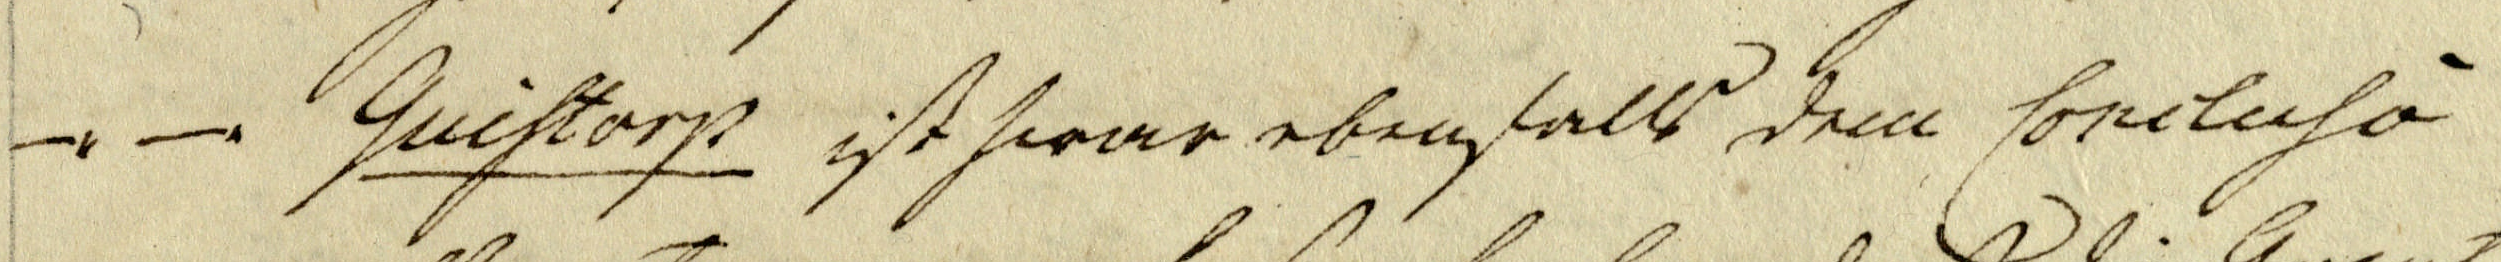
Quistorp ist zwar ebenfalls dem Concluso
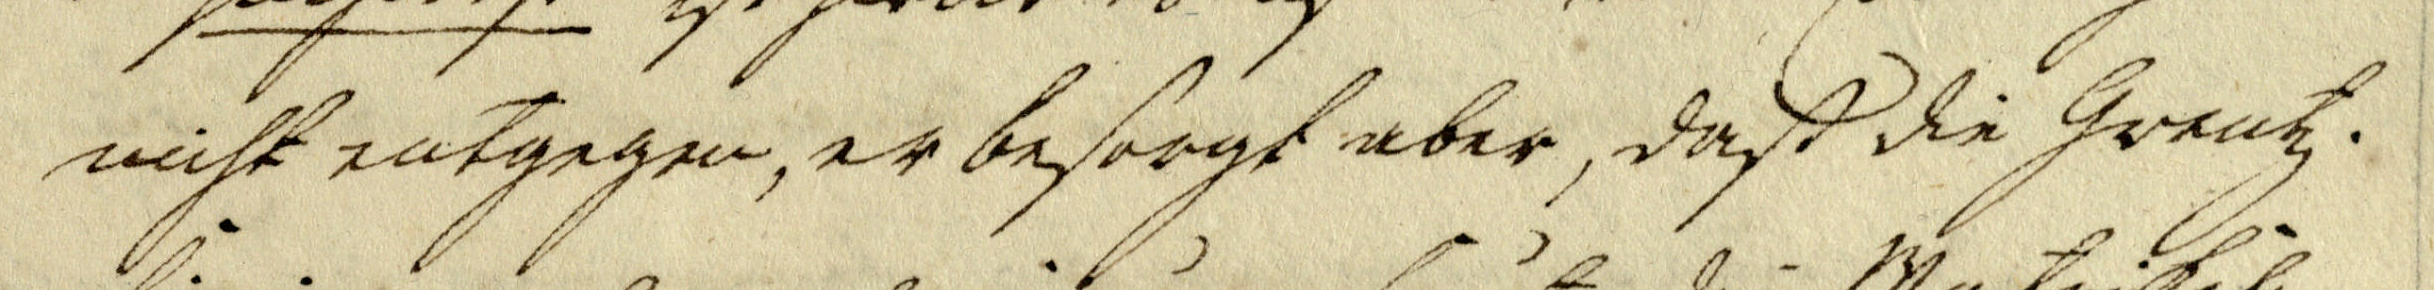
nicht entgegen, er besorgt aber, daß die Grentz¬
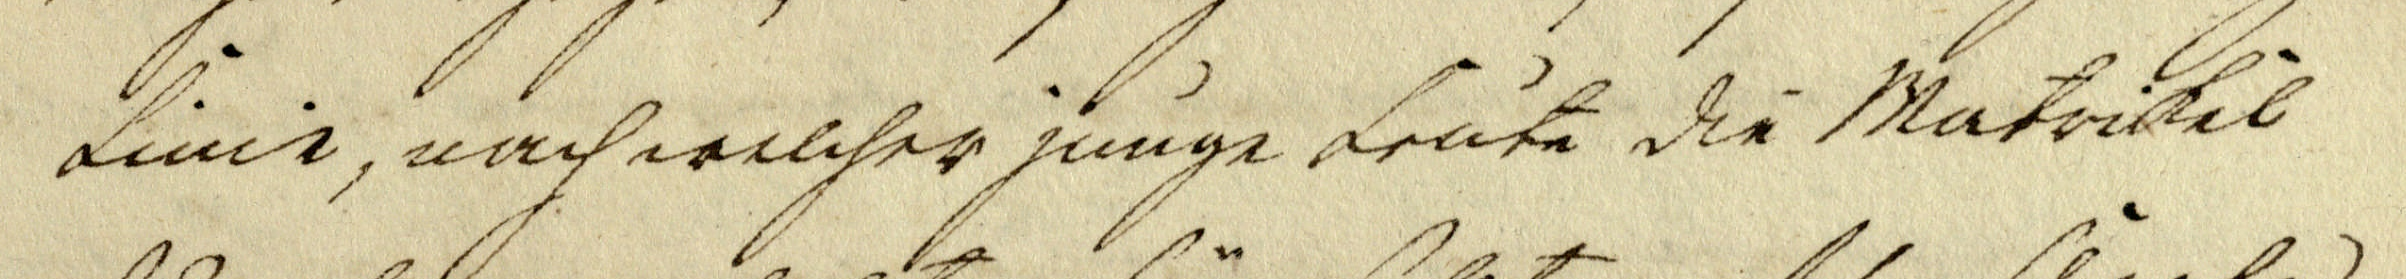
Linie, nach welcher junge Leute die Matrikel
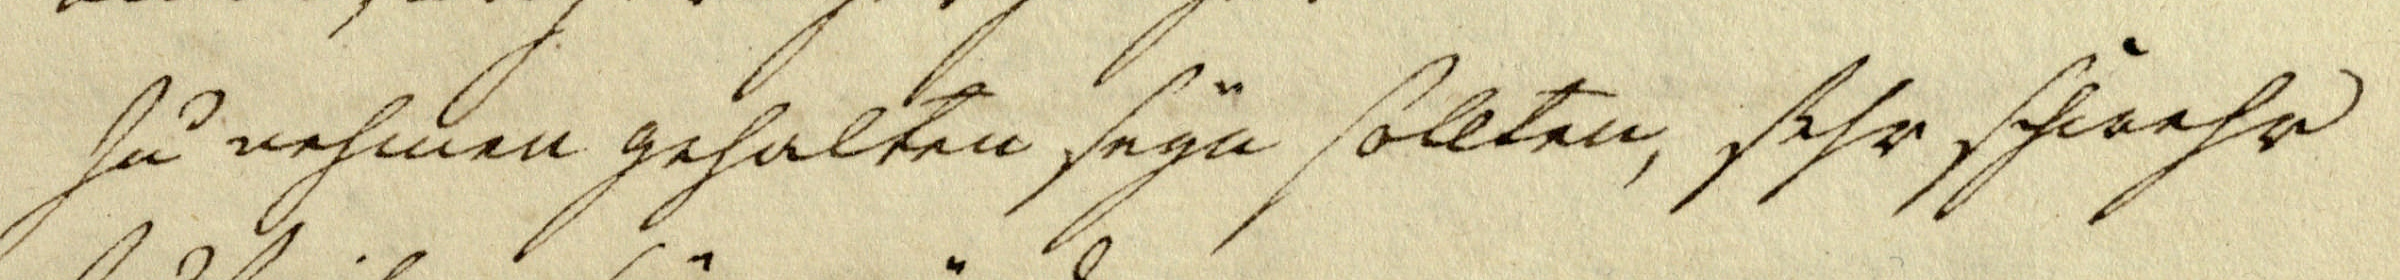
zu nehmen gehalten seÿn sollten, sehr schwehr
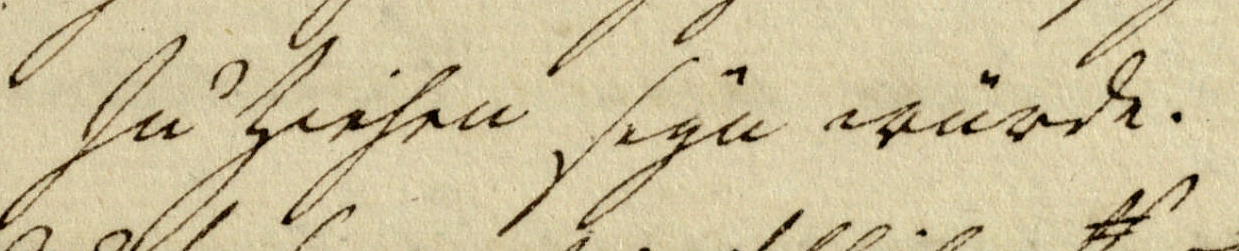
zu ziehen seÿn würde.
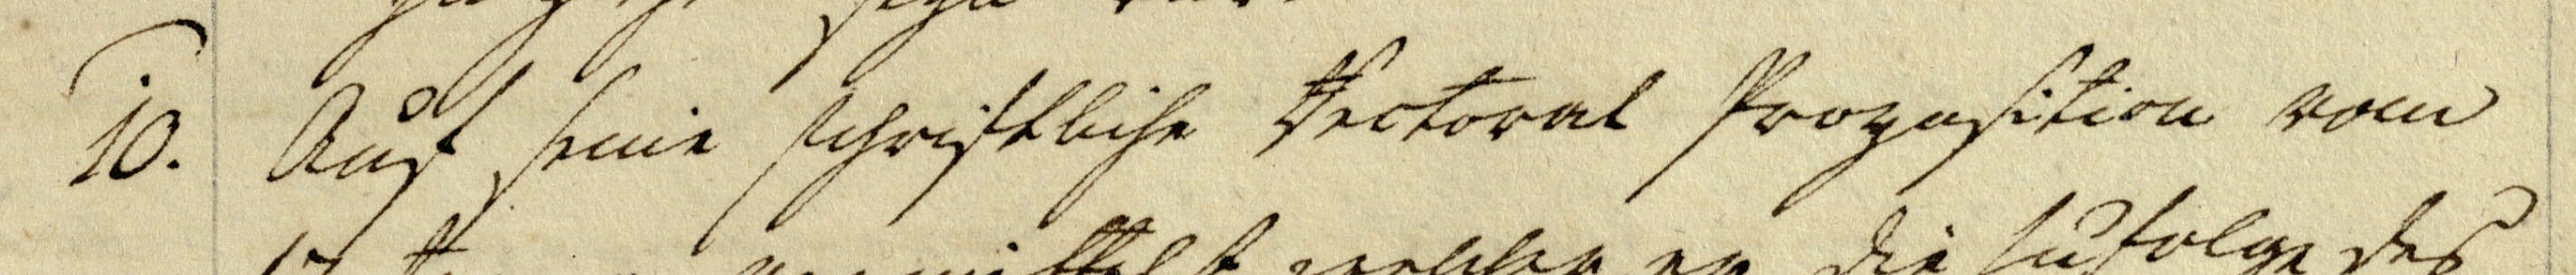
10. Auf eine schriftliche Rectoral Proposition vom
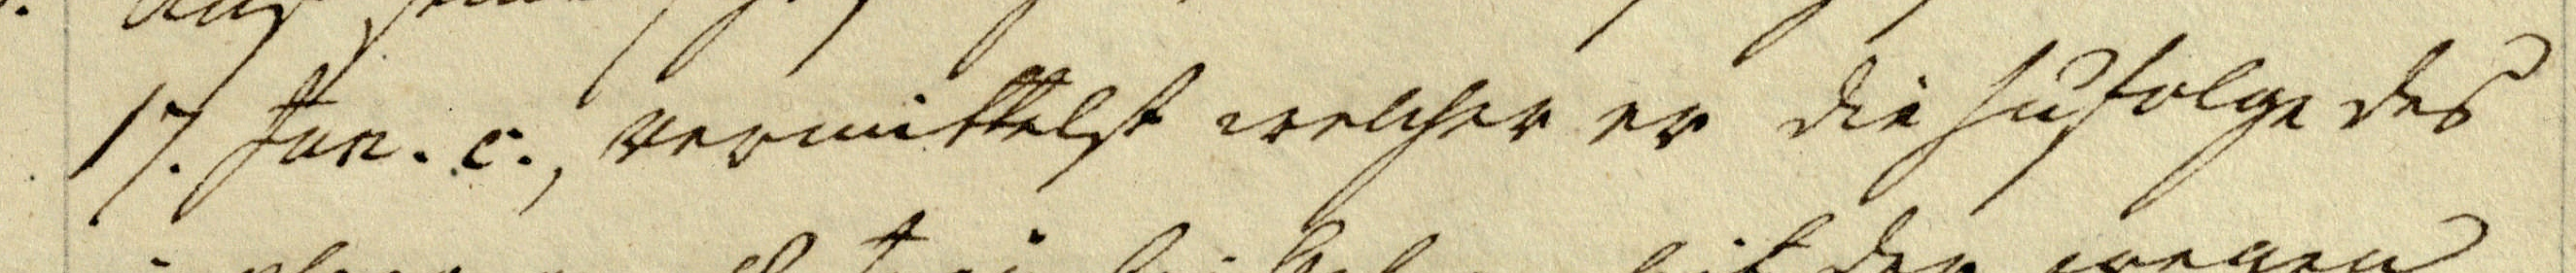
17. Jun. c., vermittelst welcher er die zufolge des
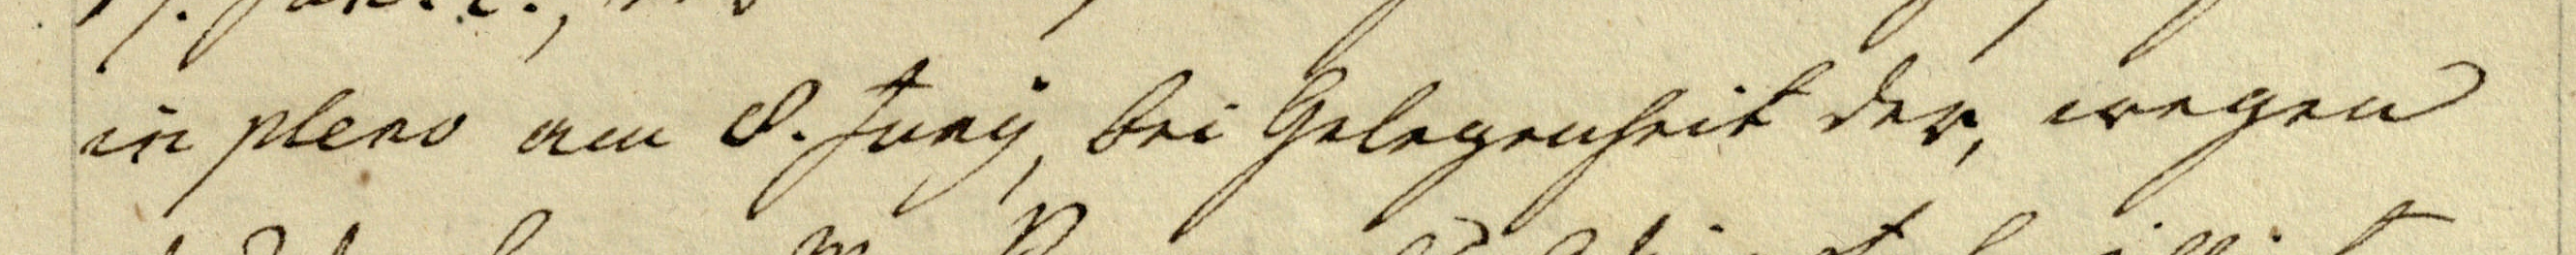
in pleno am 8. Junÿ, bei Gelegenheit der, wegen
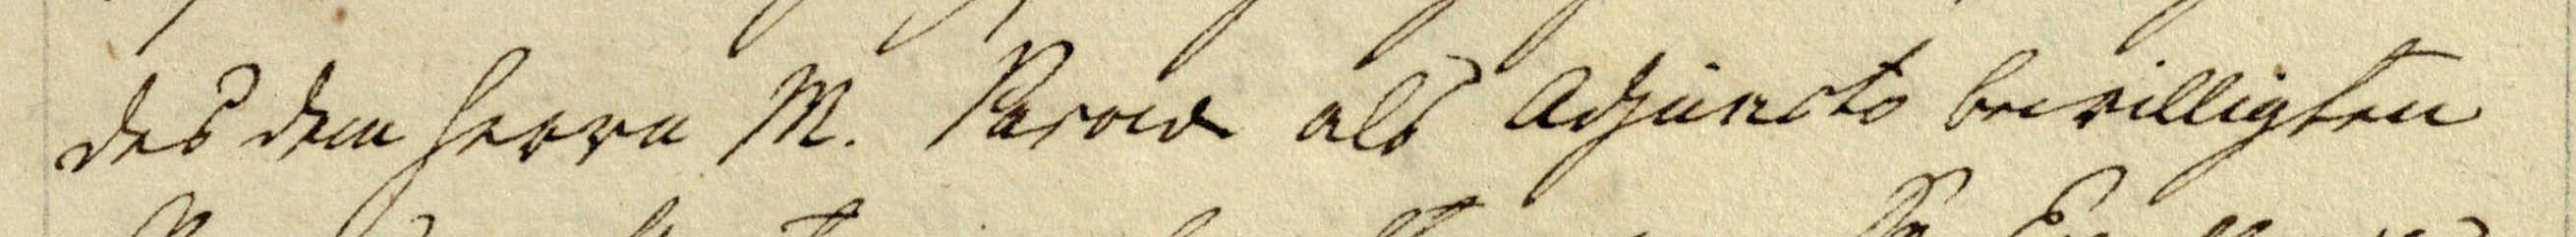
des dem Herrn M. Parow als Adjuncto bewilligten
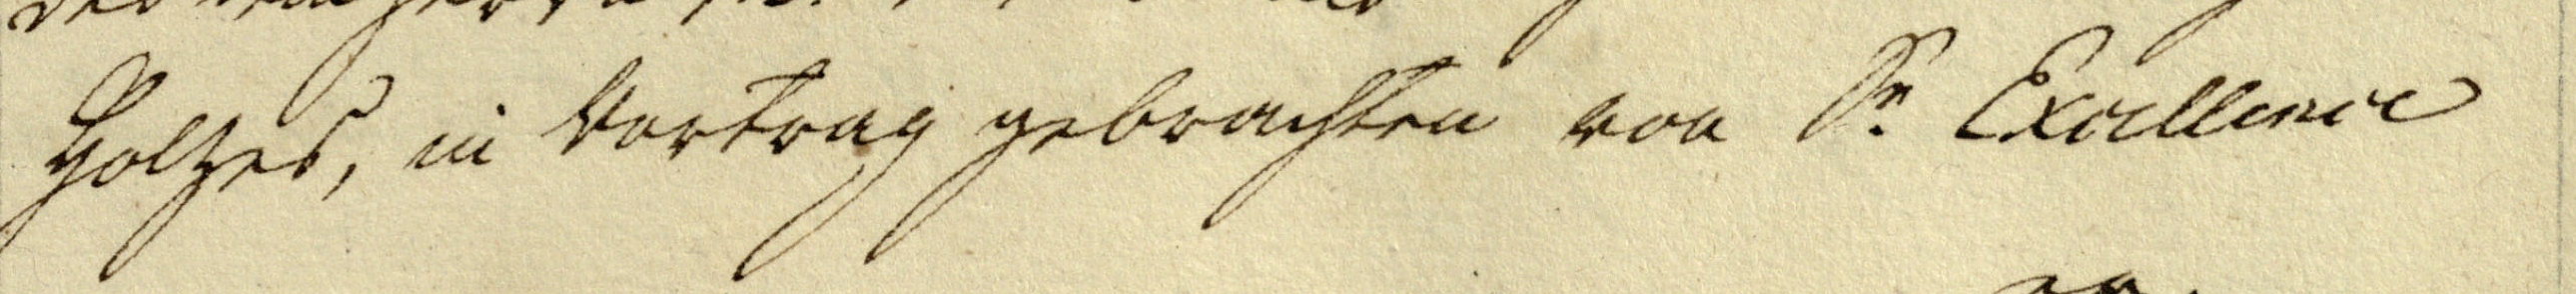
Holzes, in Vortrag gebrachten von Sr Excellence
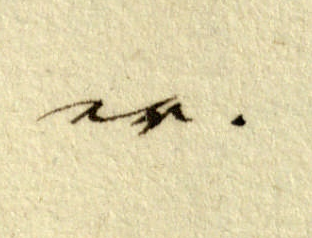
er¬
